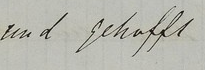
und gehofft
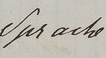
Sache von sich
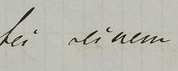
bei seinem
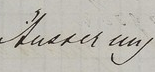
mich über die
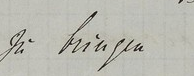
des letztern
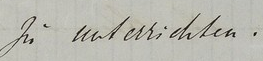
zu unterrichten.
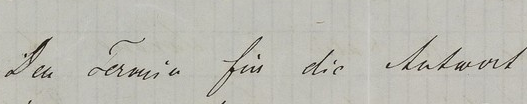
Den Termin für die Antwort
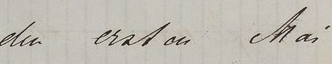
der Cantone auf die
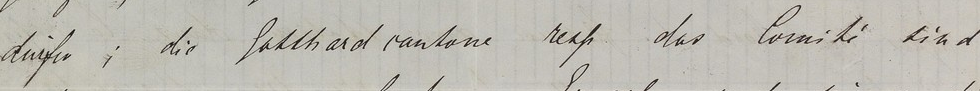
dürfen; die Gotthardcantone resp. das Comité sind
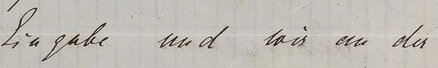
Eingabe und wir an der
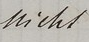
nicht
